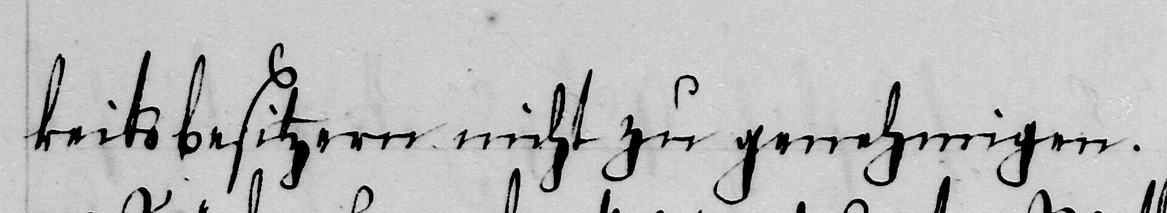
keitsbesitzern nicht zu genehmigen.
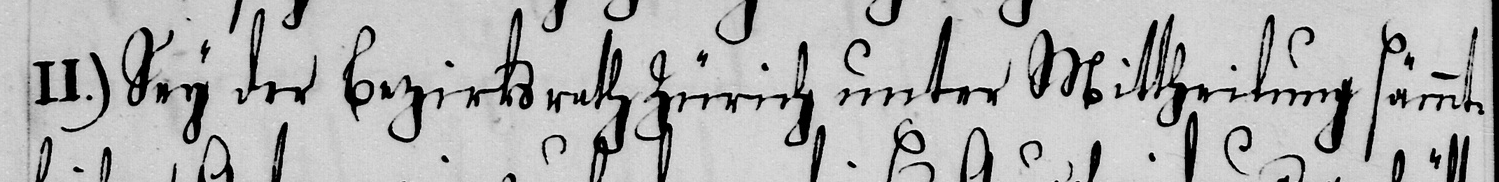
I.) Sey der Bezirksrath Zürich unter Mittheilung sämm¬
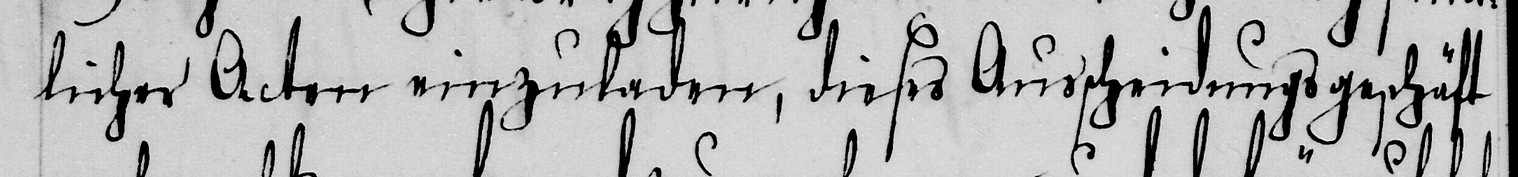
tlicher Acten einzuladen, dieses Ausscheidungsgeschäft
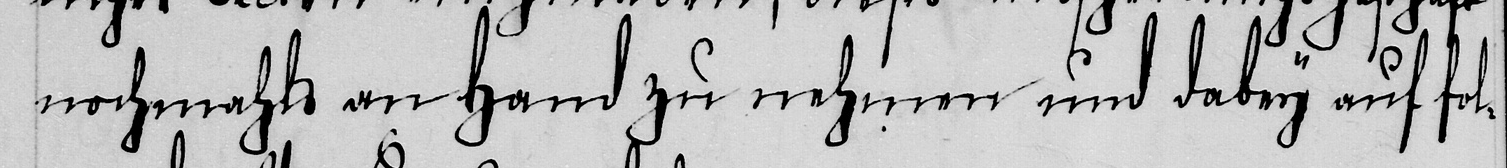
nochmals an Hand zu nehmen und dabey auf fo¬
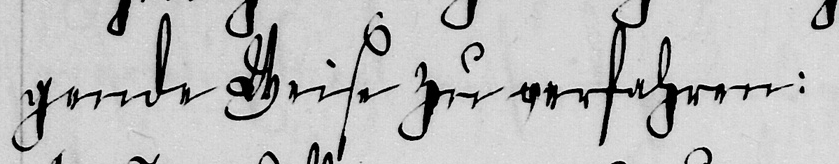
lgende Weise zu verfahren:
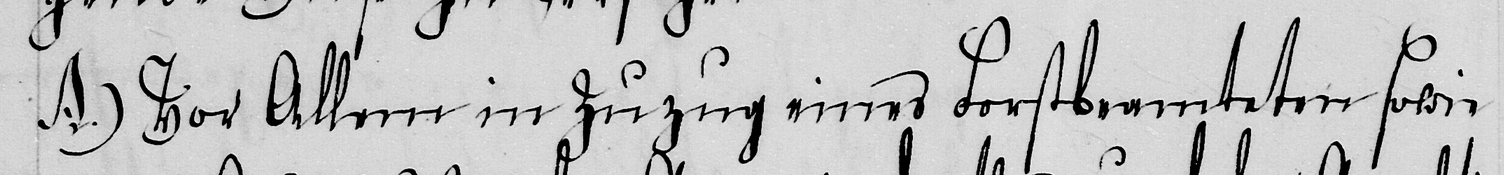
A.) Vor Allem im Zuzug eines Forstbeamteten sowie
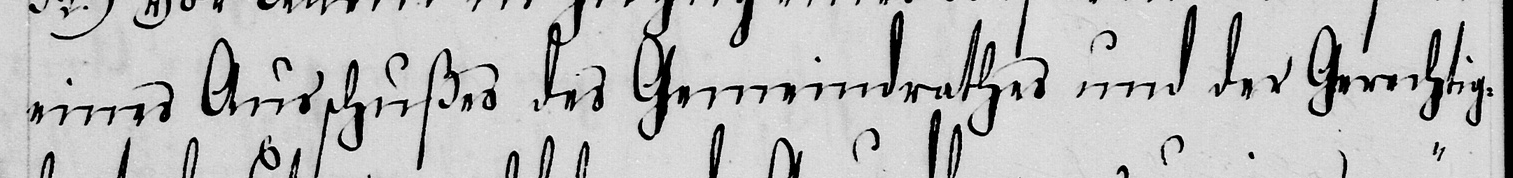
eines Ausschußes des Gemeindrathes und der Gerechtig¬
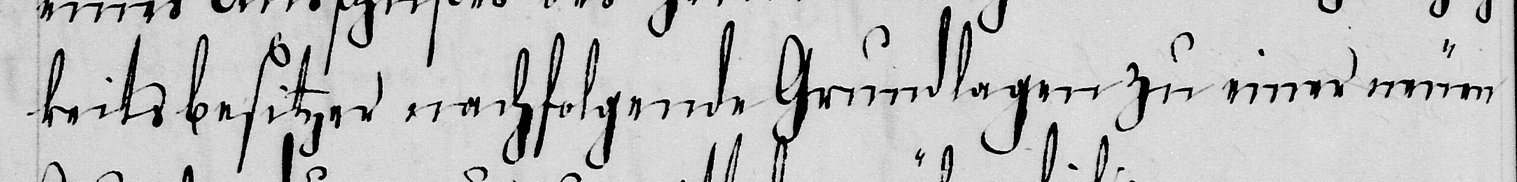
keitsbesitzer nachfolgende Grundlagen zu einer neuen
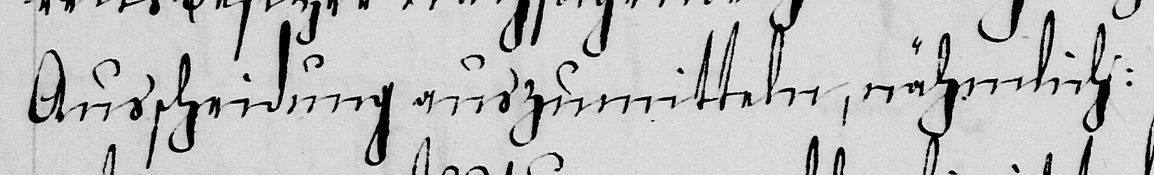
Ausscheidung auszumitteln, nähmlich:
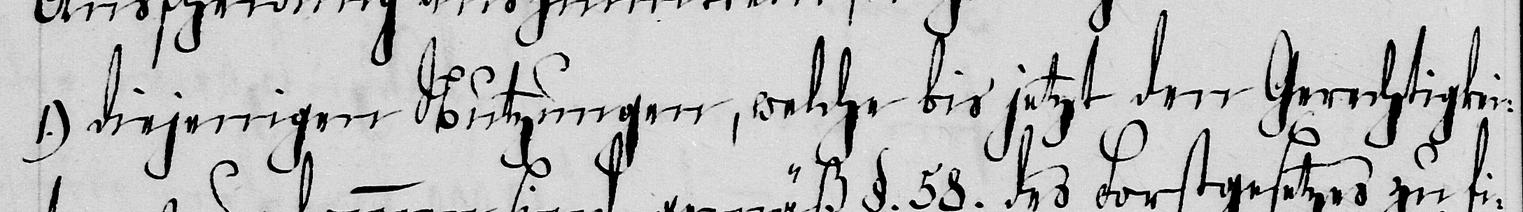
1.) diejenigen Nutzungen, welche bis jetzt den Gerechtigke¬
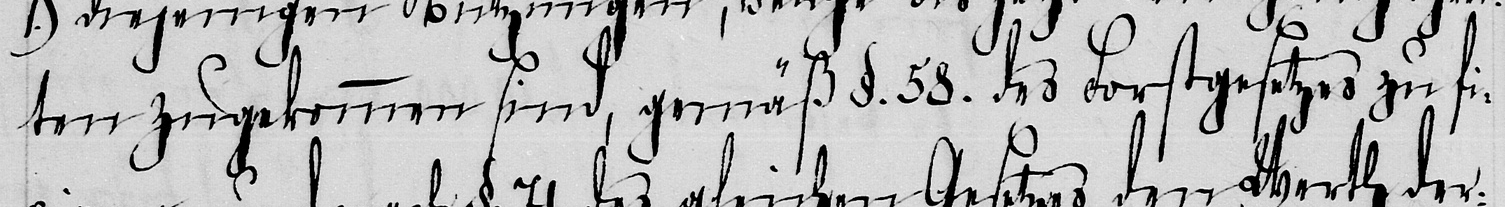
iten zugekommen sind, gemäß §. 58. des Forstgesetzes zu fi¬
